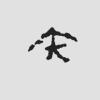內
